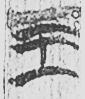王
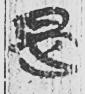是
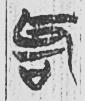{㠯ㅋ}
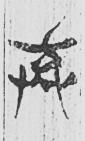弃
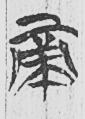帝
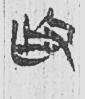{乍攴}
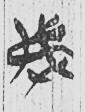弗
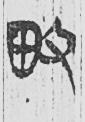畋
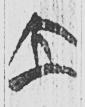立
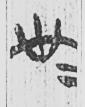卅=
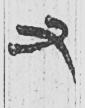又
